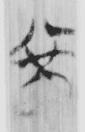兌
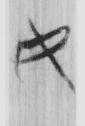女
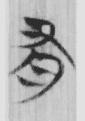有
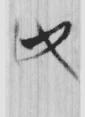女
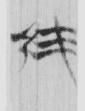隹
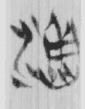{沈臼}
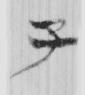子
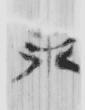余
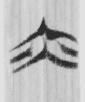亦
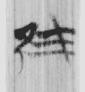隹
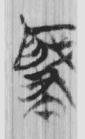肇
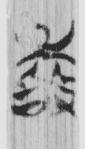{老日攴}
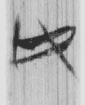女
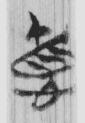惪
